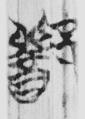{邑卯酉}
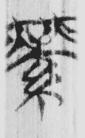縈
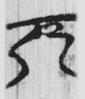厄
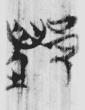{邑臼人土}
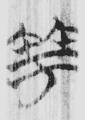竽
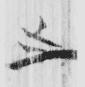之
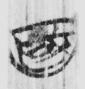國
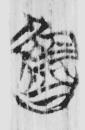魯
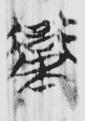衛
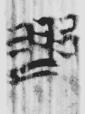鄝
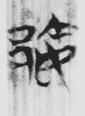{邑午女}
